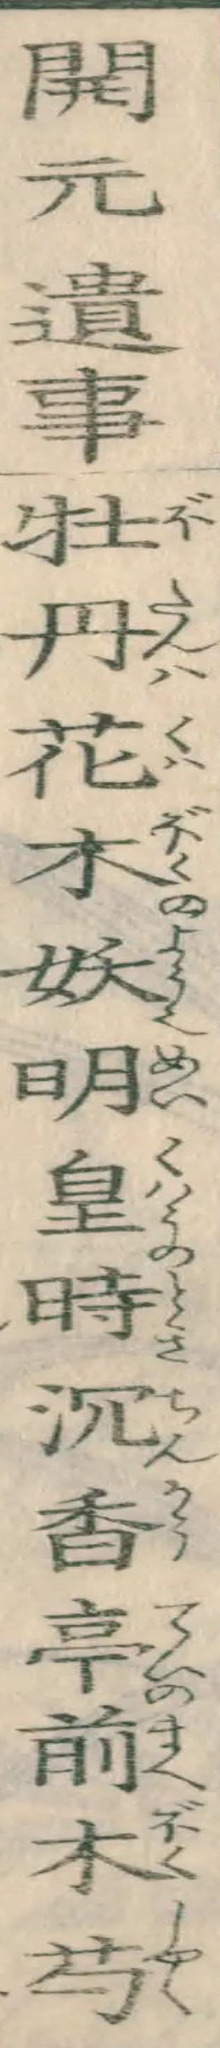[開元遺事]牡丹花木妖明皇時沈香亭前木芍
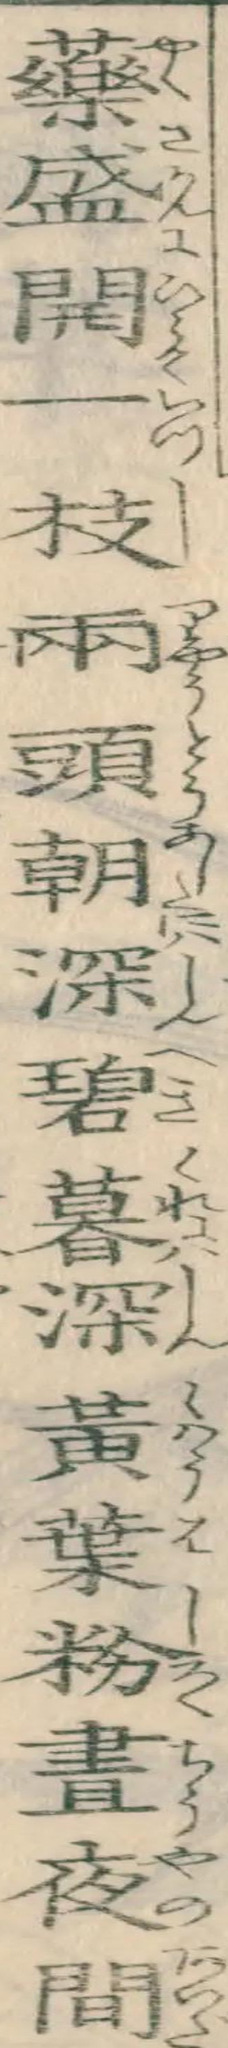薬盛開一枝両頭朝深碧暮深黄葉粉昼夜間
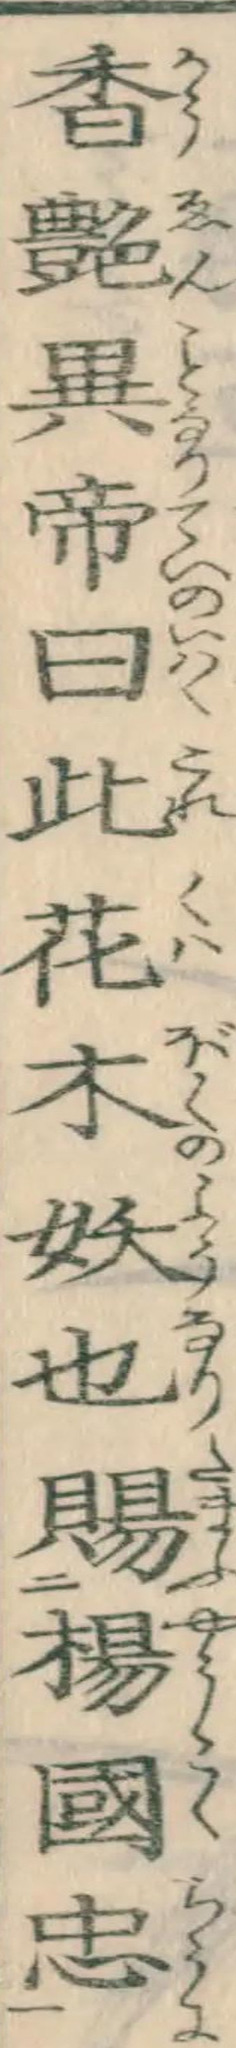香艶異帝曰此花木妖也賜楊国忠

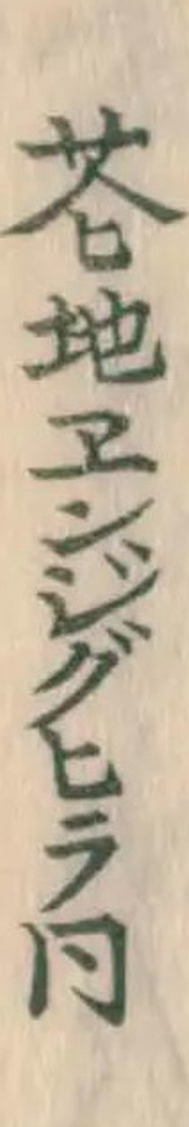花地ヱンジグヒラ同
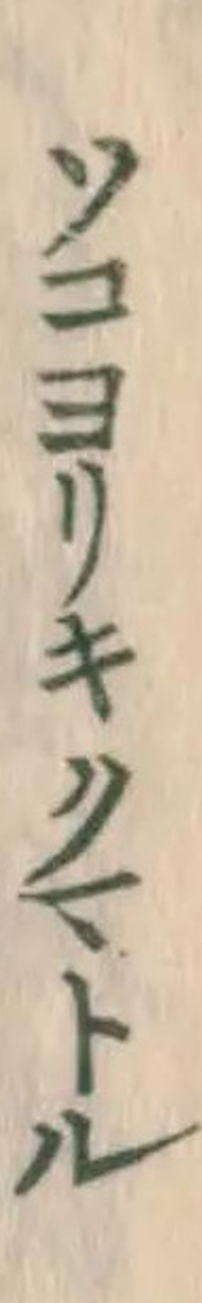ソコヨリキクマトル
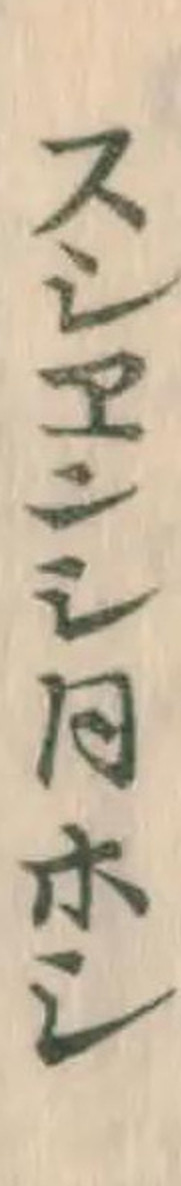スシヱンシ同ホシ
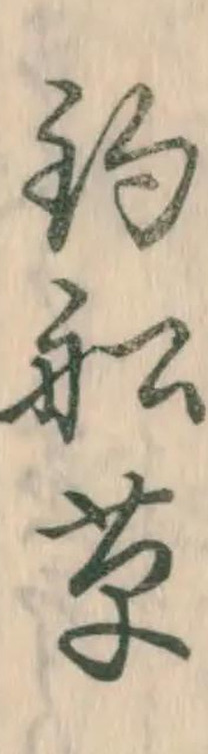釣船草
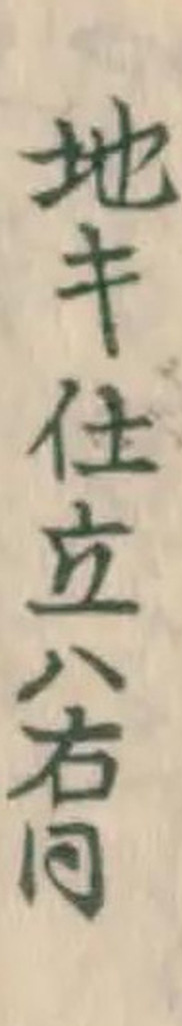地キ仕立ハ右同
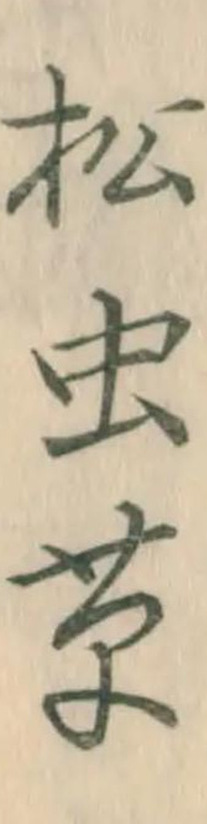松虫草

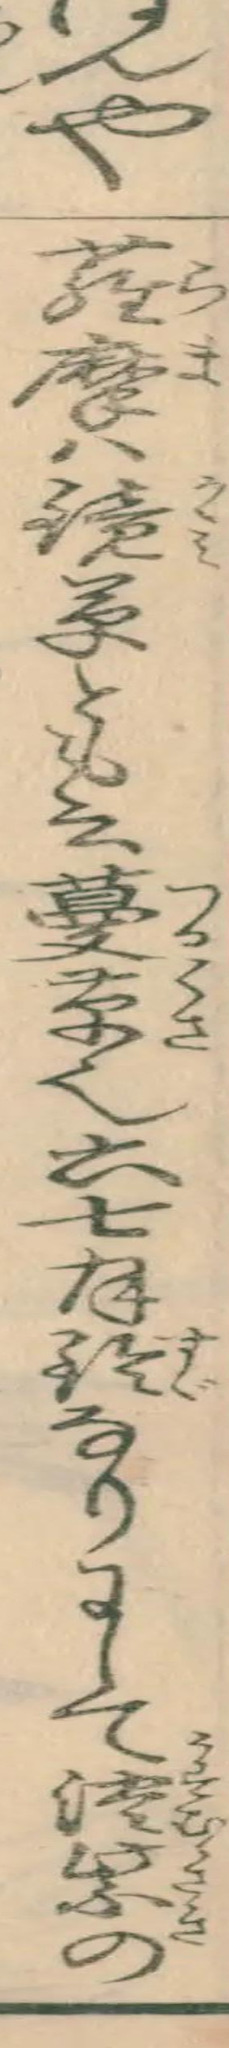蘿摩は鏡草とも云蔓草也六七月鈴なりにして淡紫の
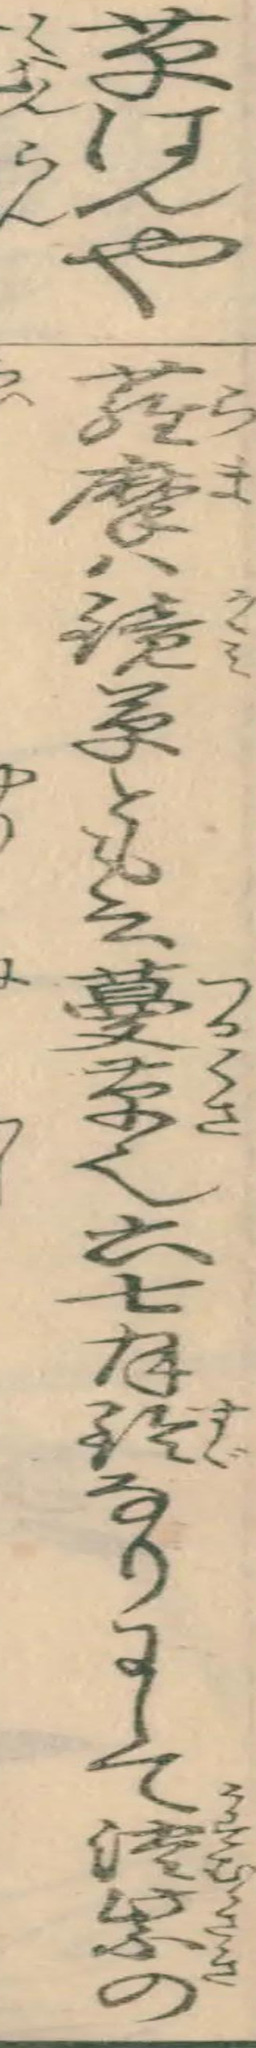蘿摩は鏡草とも云蔓草也六七月鈴なりにして淡紫の
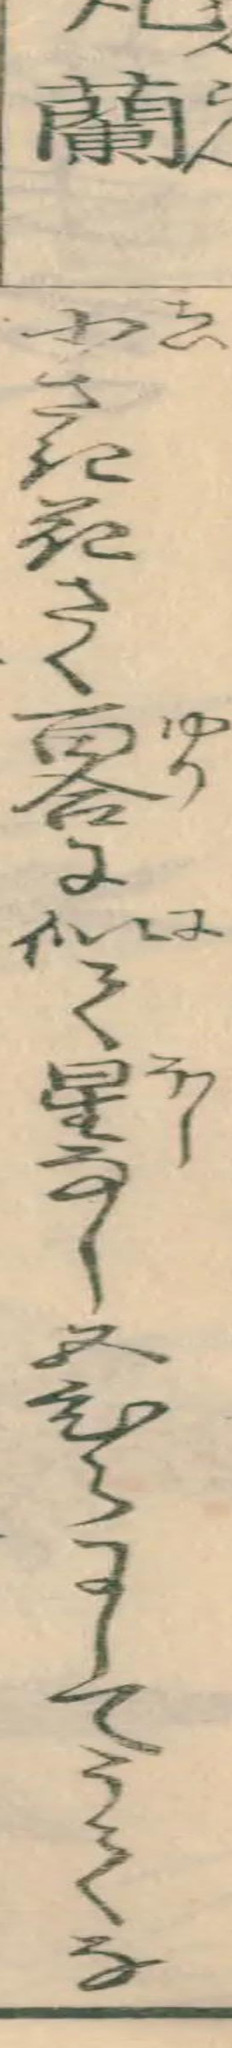小さき花さく百合に似て星なし五ひらにしてうてな
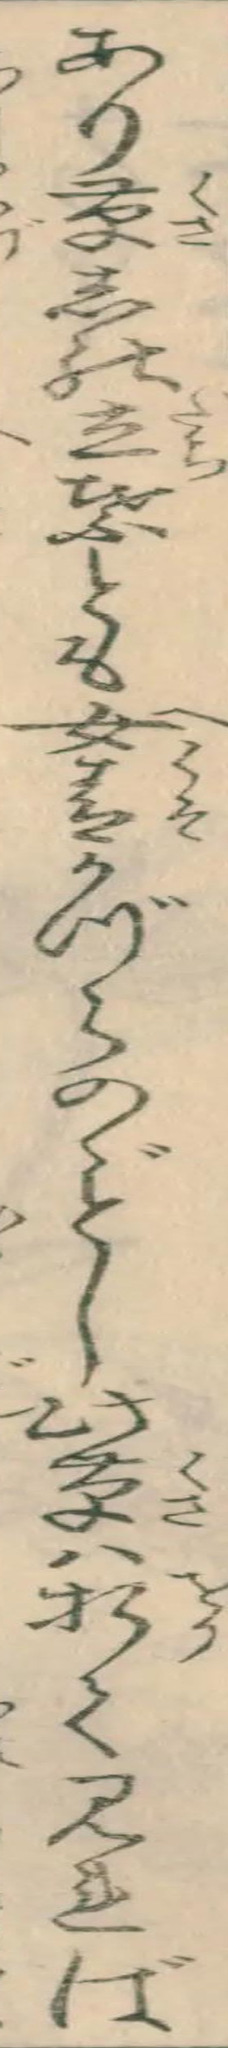あり草しの立葉とも女青かづらのごとし此草は折て見れば
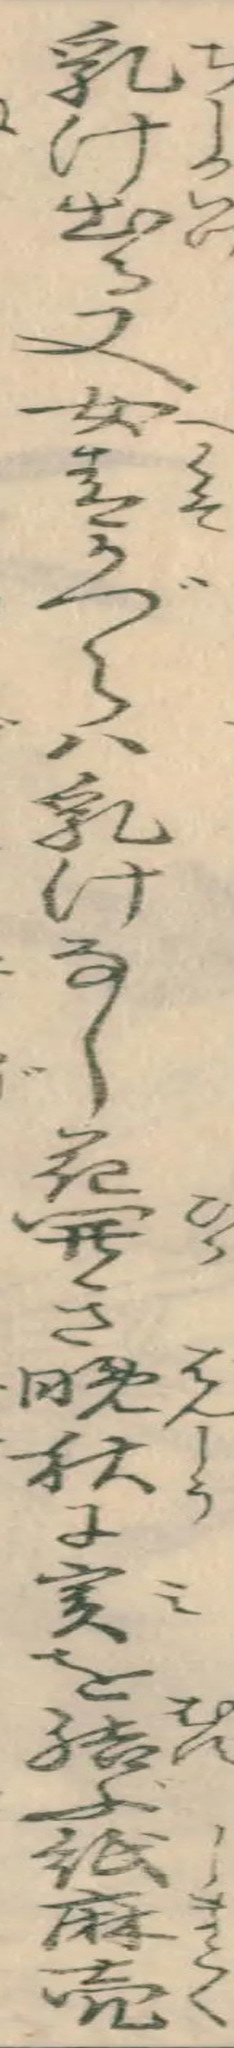乳汁出る又女青かづらは乳汁なし花開き晩秋に実を結ぶ紙麻殻
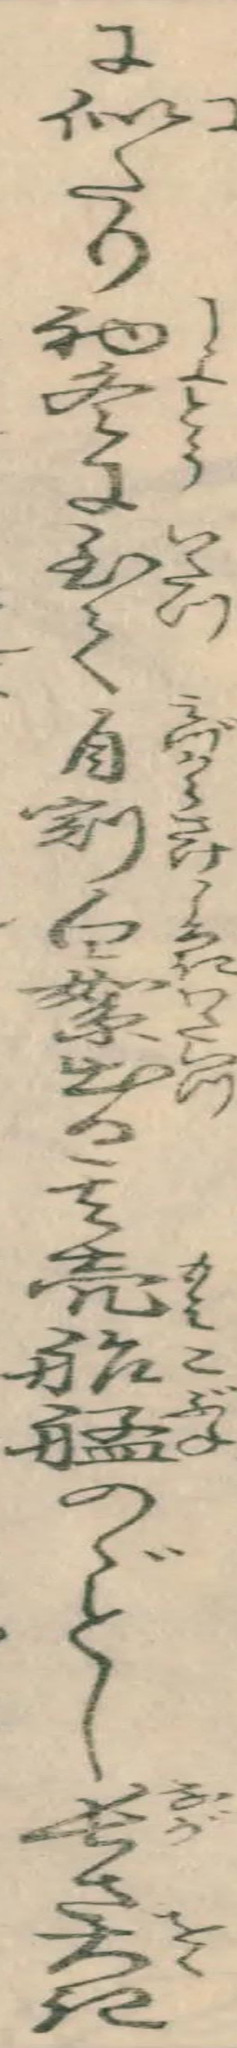に似たり初冬に至て自割白絮出る其殻船艋のごとし長さ大き
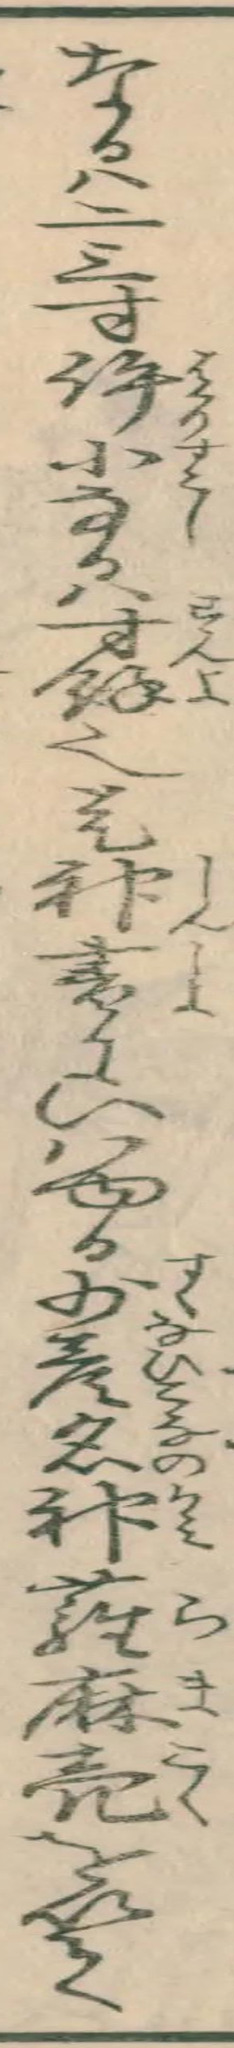なるは二三寸許小なるは寸余也是神書にいはゆる少彦名神蘿麻殻を以て
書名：畫本野山草. [5]
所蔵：国立国会図書館 National Diet Library, JAPAN
